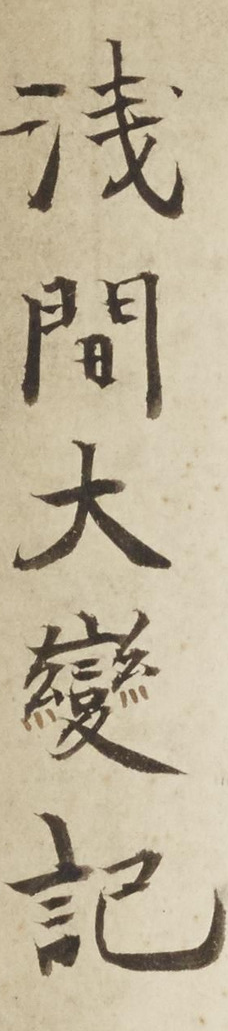浅間大変記

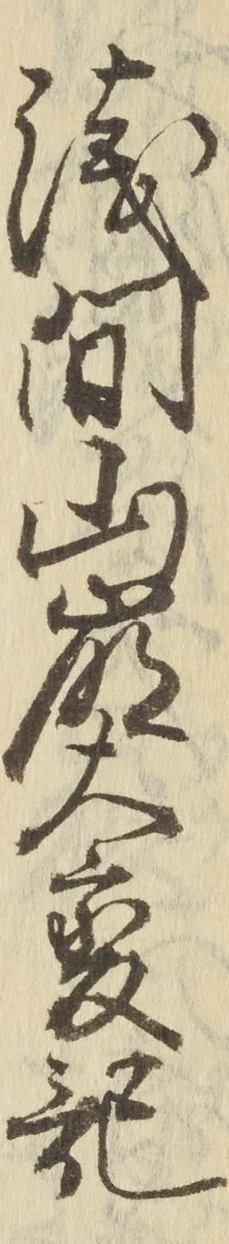浅間山崩大変記
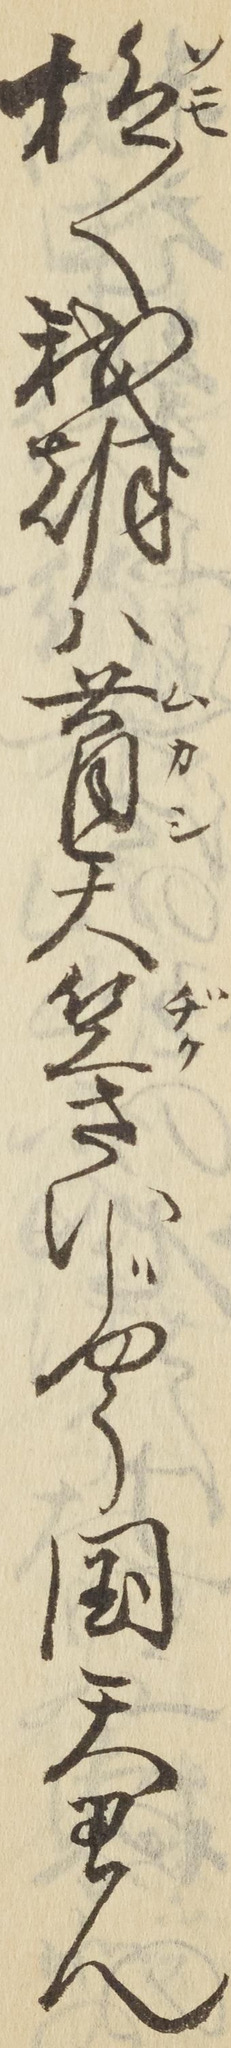抑々我朝は昔天竺さいじやう国天りん
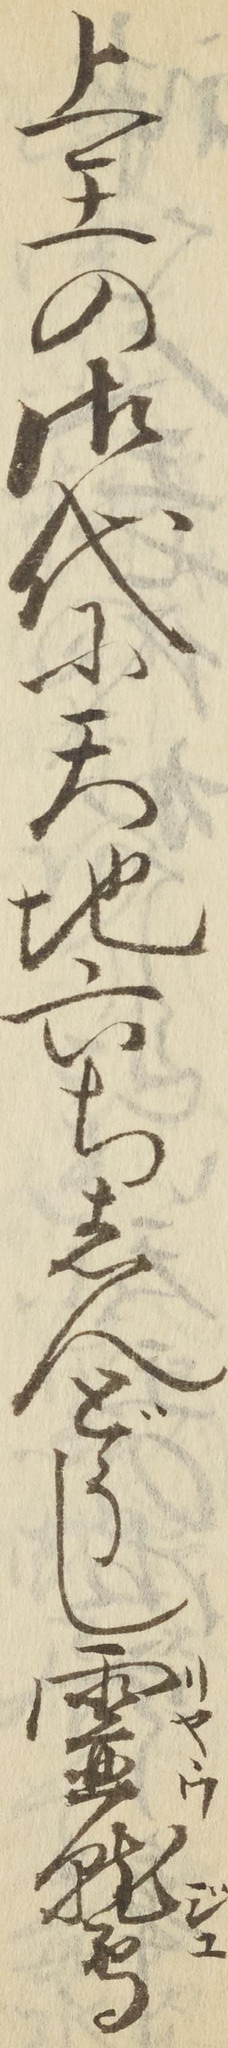上王の御代に天地六ちしんどうし霊就寺
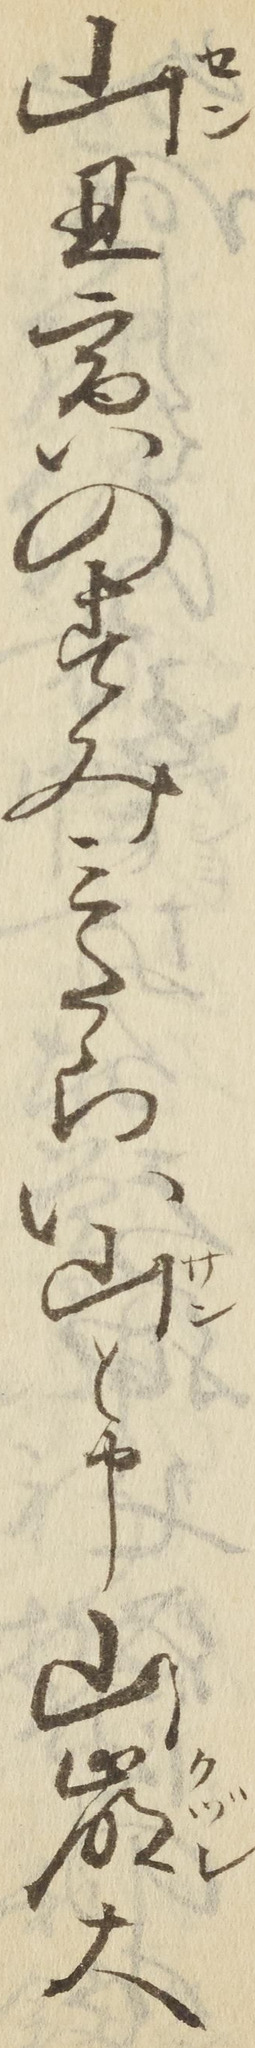山丑寅のすみみたらい山と申山崩大
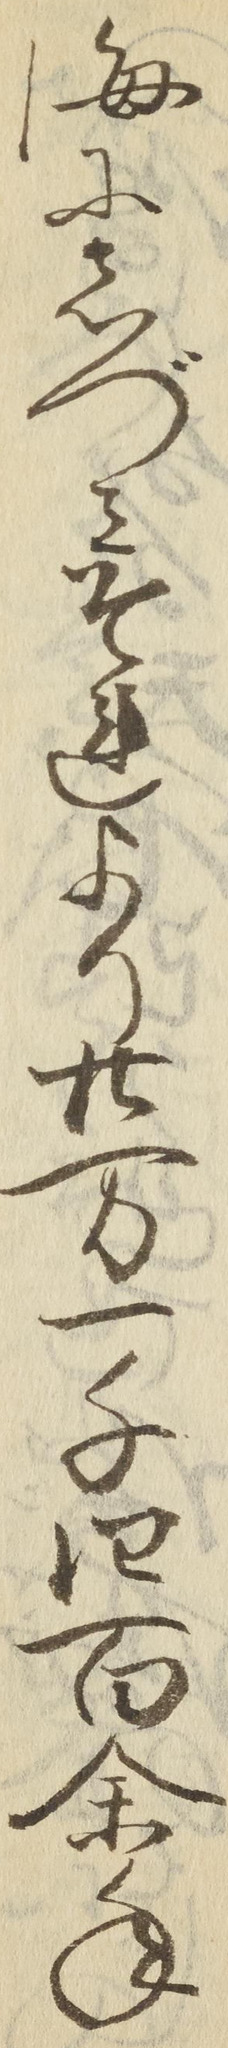海にしづみそれより廿万一千四百余年
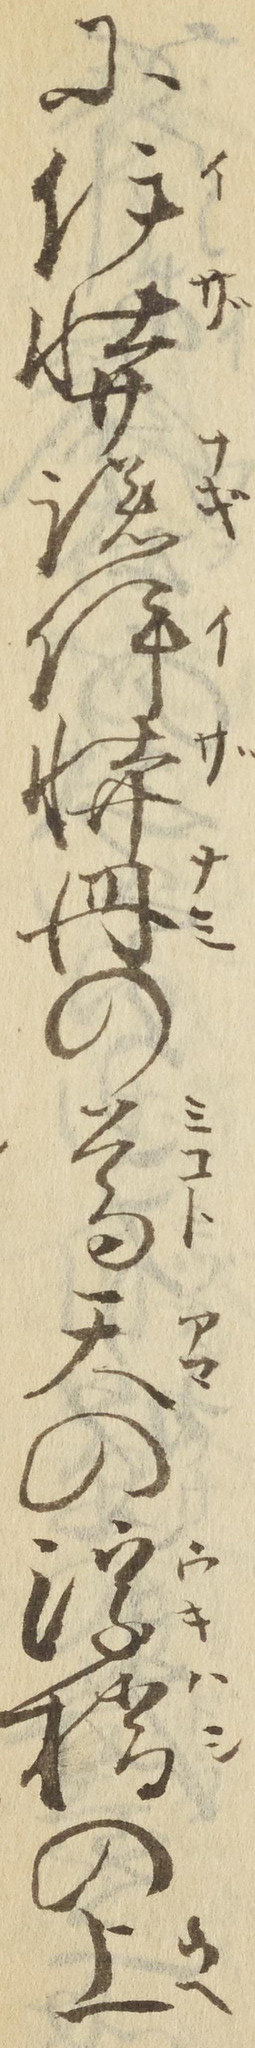に伊弉諾伊弉丹の尊天の浮橋の上
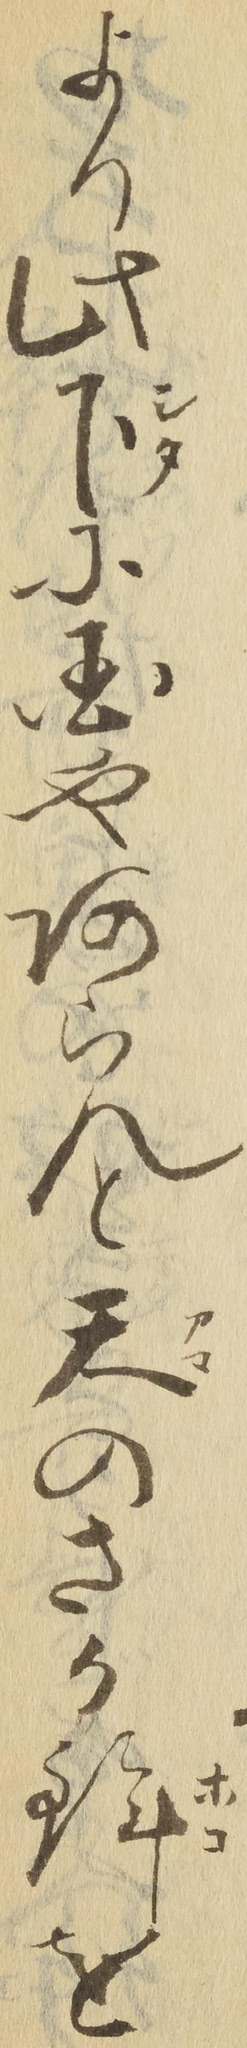より此下に国やあらんと天のさか鉾を

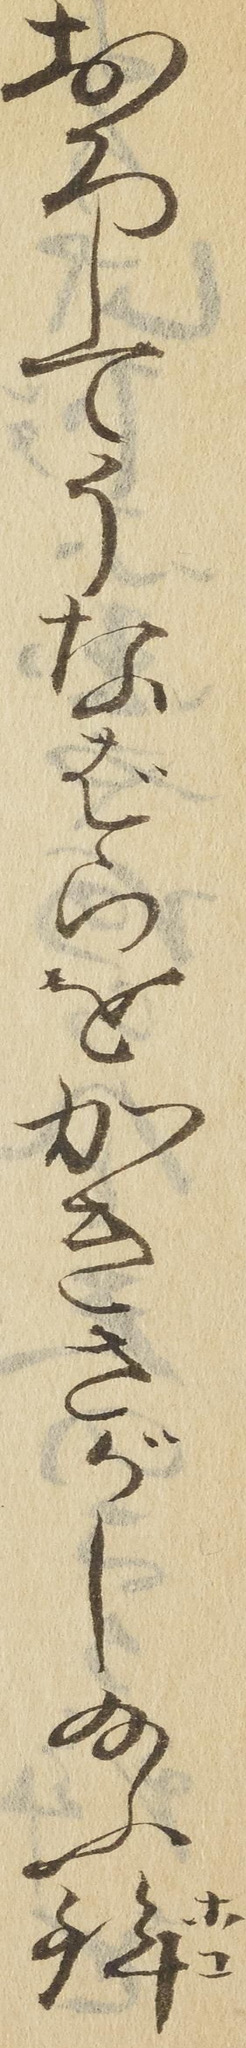おろしてうなばらをかきさがし給ふ鉾
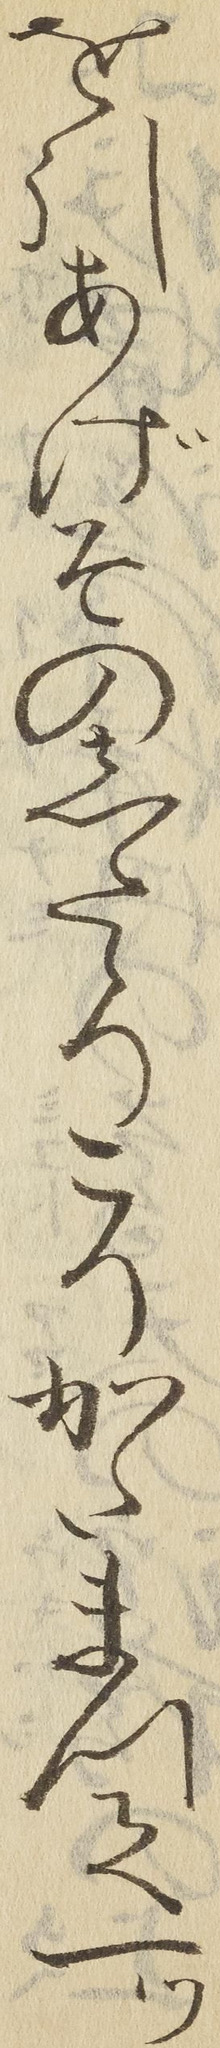を引あげそのしたかこりかたまつて一ッ
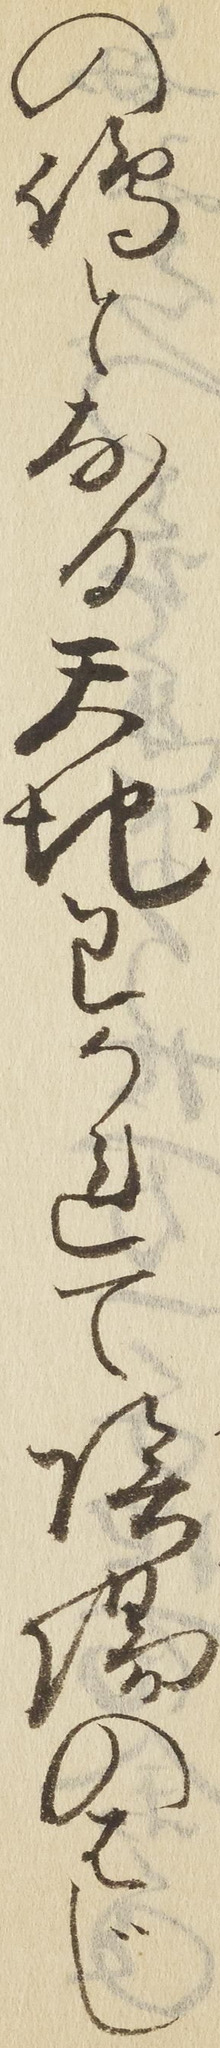の嶋となる天地わかれて陰陽のはじ
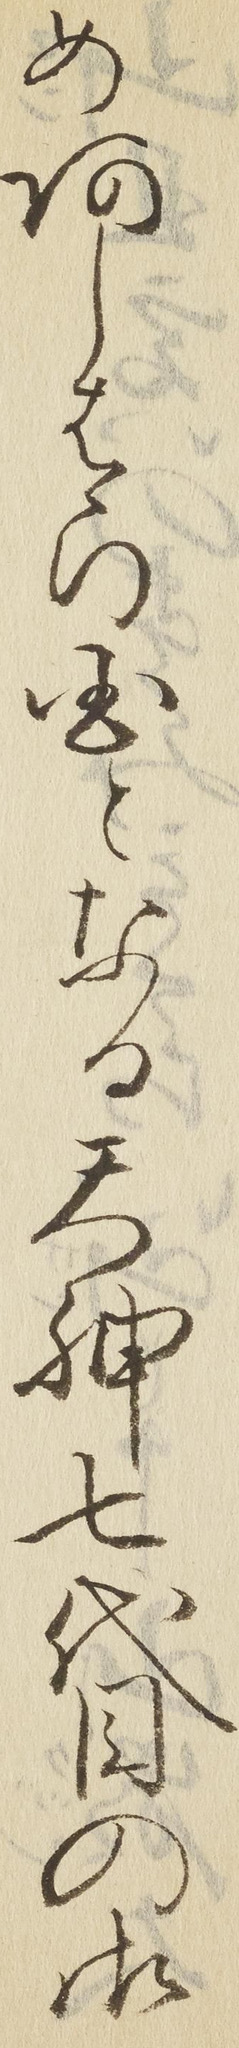めあしはらの国となる天神七代目の御
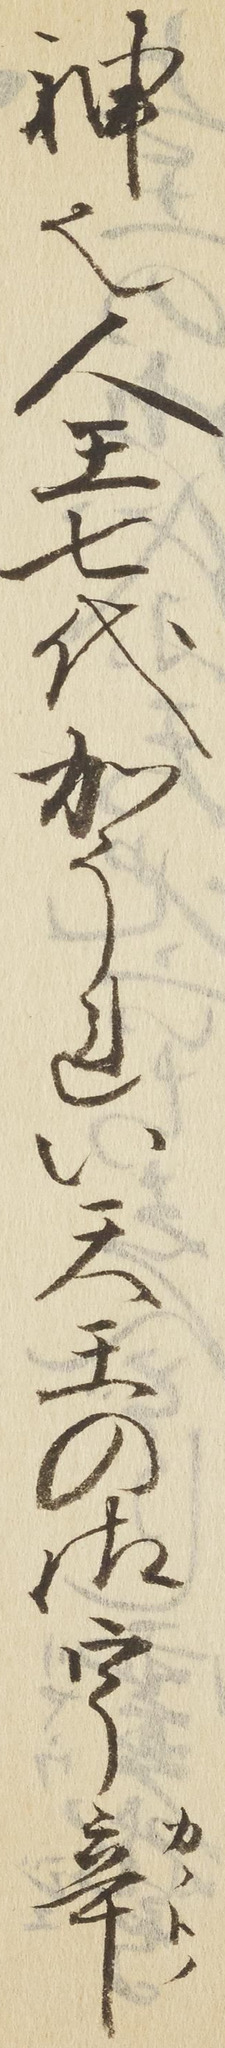神也人王七代かうれい天王の御宇辛
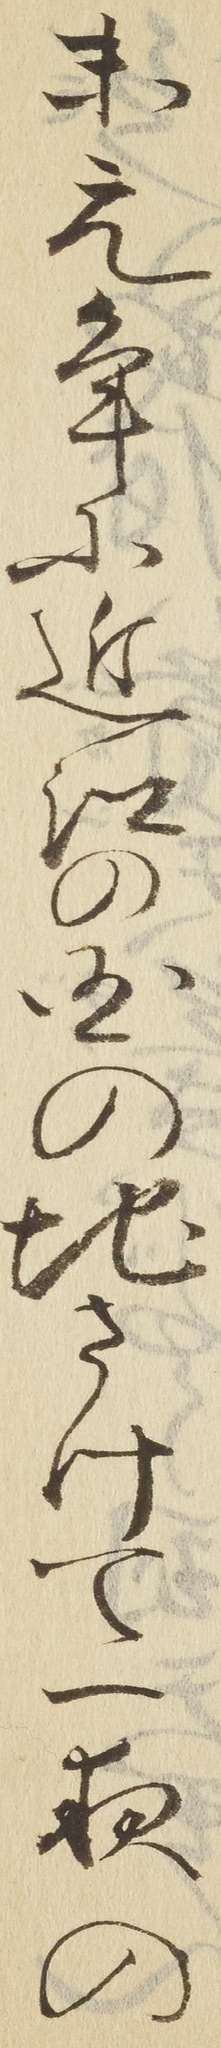未元年に近江の国の地さけて一夜の
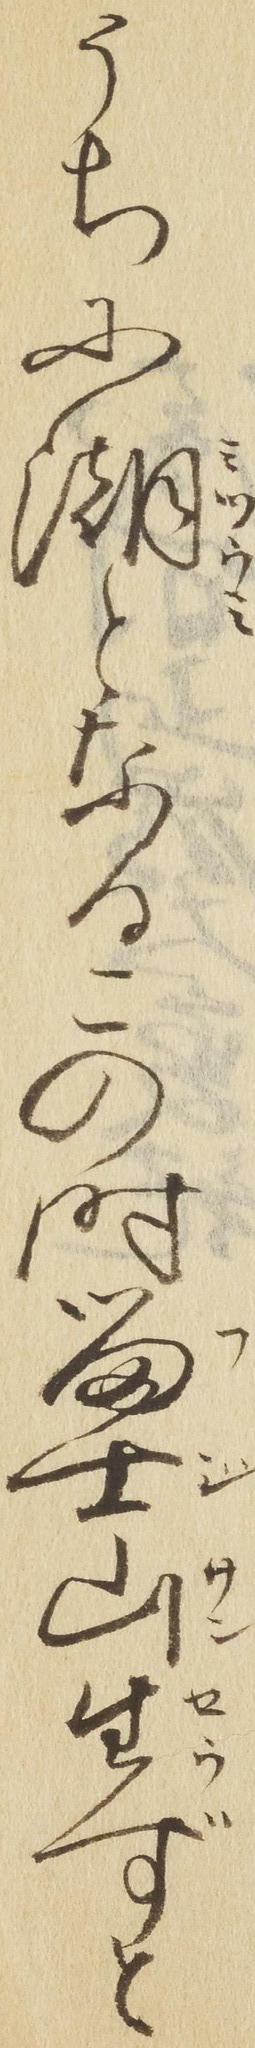うちに湖となるこの時冨士山生ずと
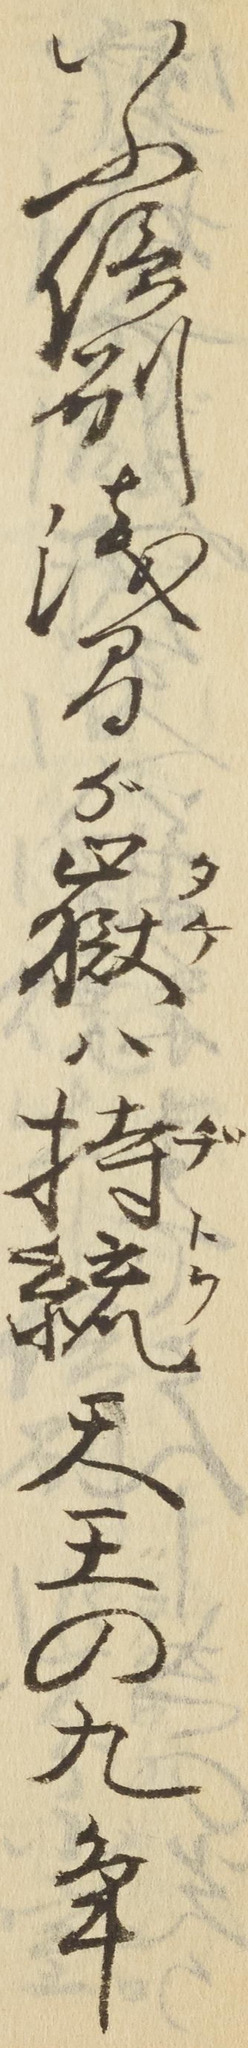いふ信州浅間が嶽は持統天王の九年
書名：浅間大變記
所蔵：東京大学地震研究所図書室 Earthquake Research Institute Library, The University of Tokyo, JAPAN
